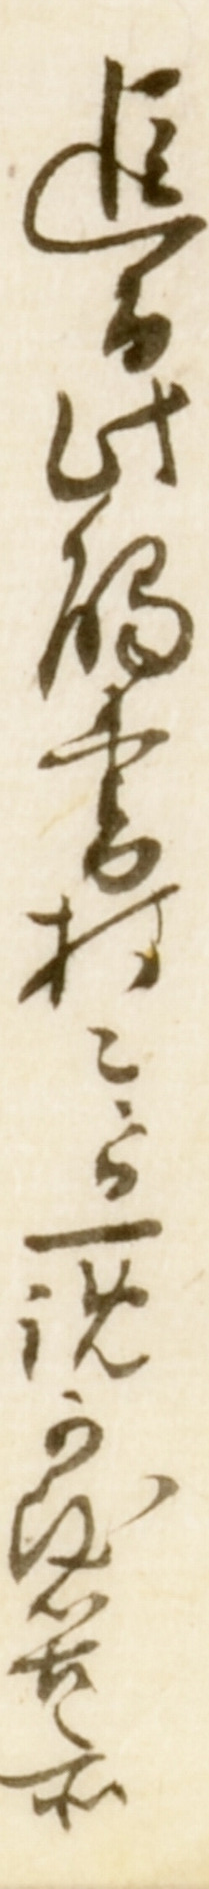追而此触書村々ニ而一覧可致筈之所
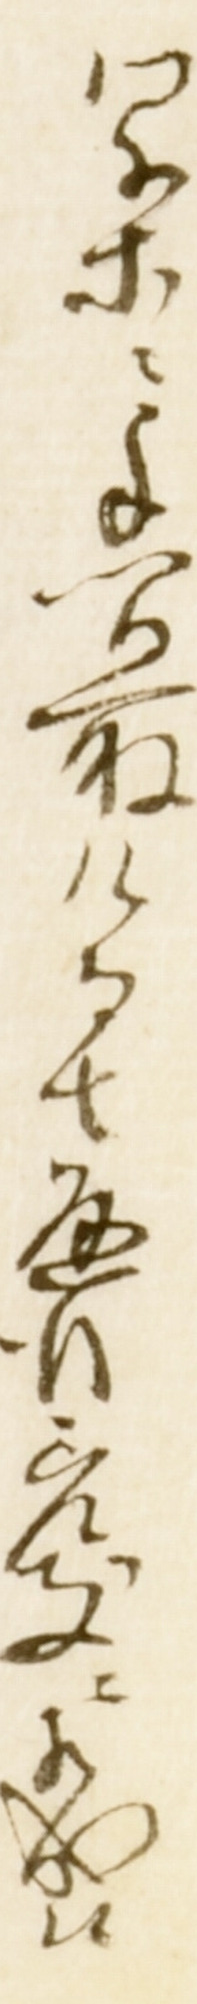写等ニ手間取候而者通行差支ニ相成候
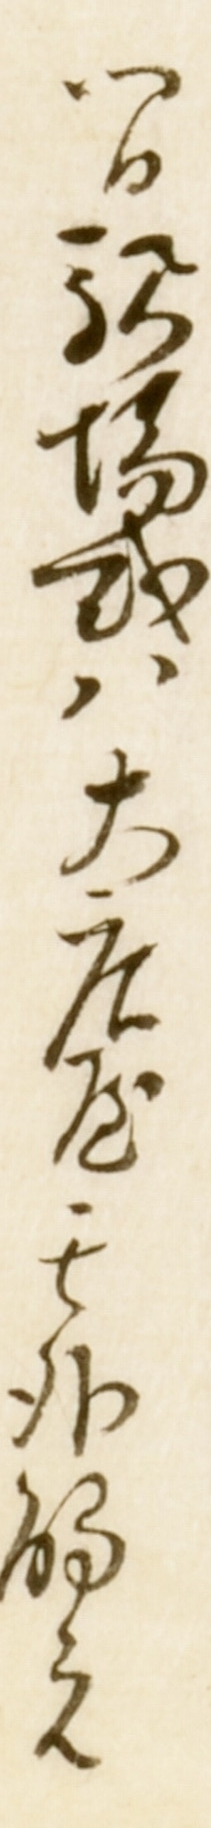間駅場或ハ大庄屋其外触元
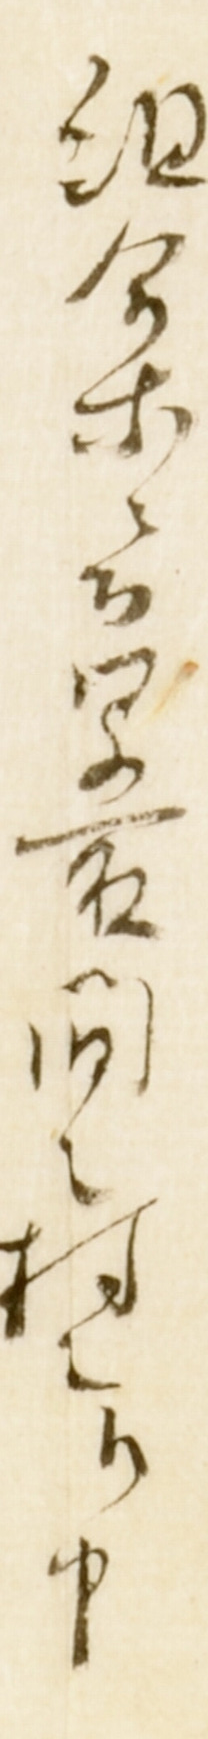組合等ニ而写取間之村々江申
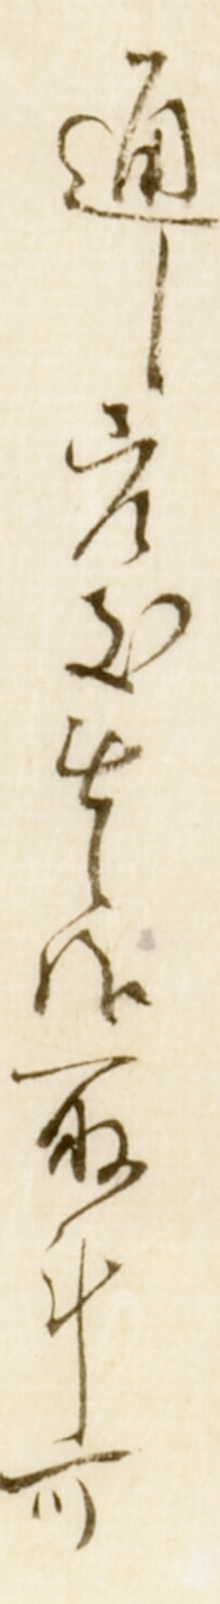通し差支無之様取斗可
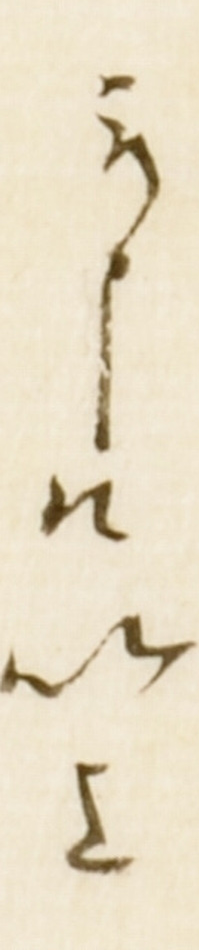被申候以上
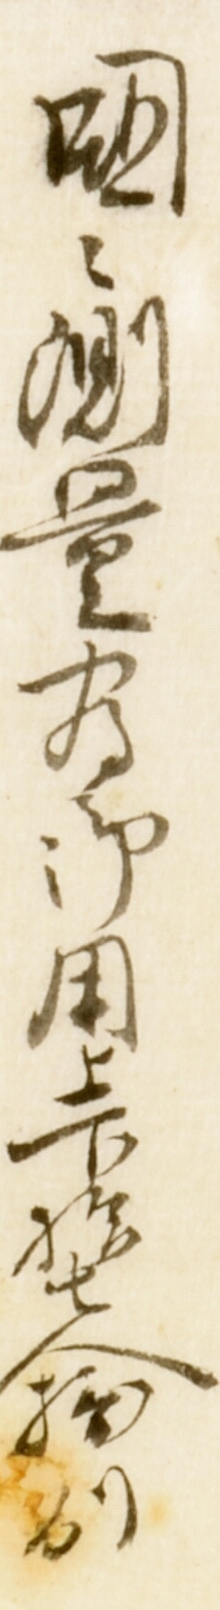國々測量為御用上下拾七人摂州
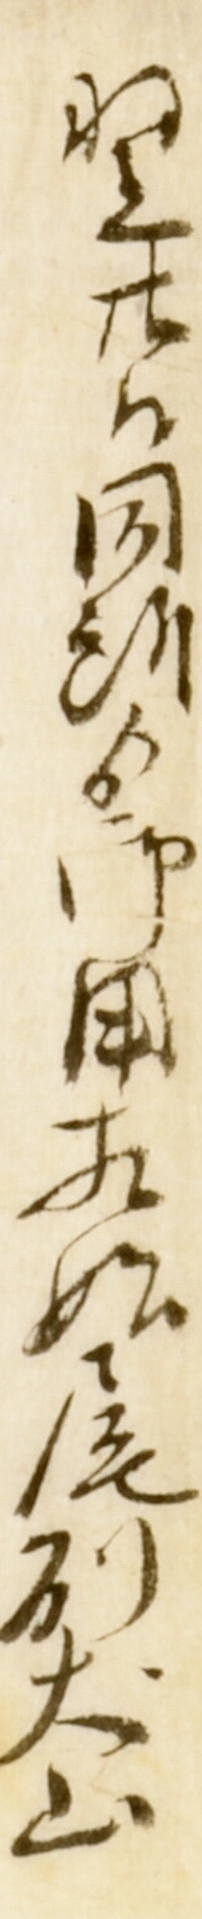翌廿日同所ゟ御用相始尾州犬山
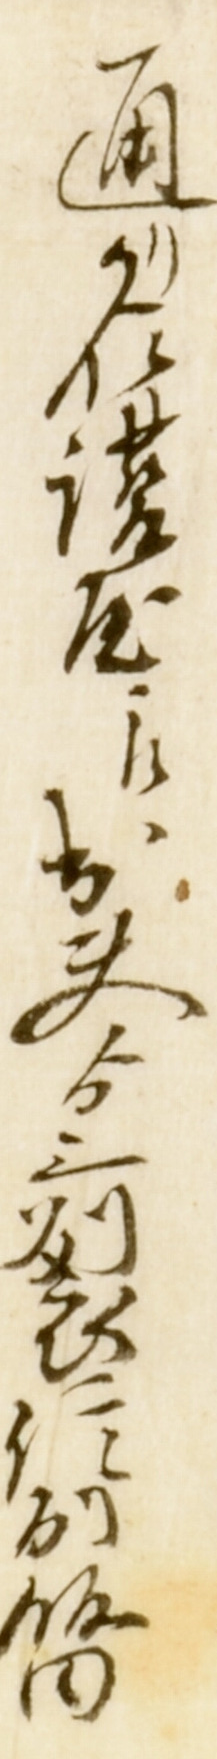通り名護屋江出夫ゟ三州衣信州飯田
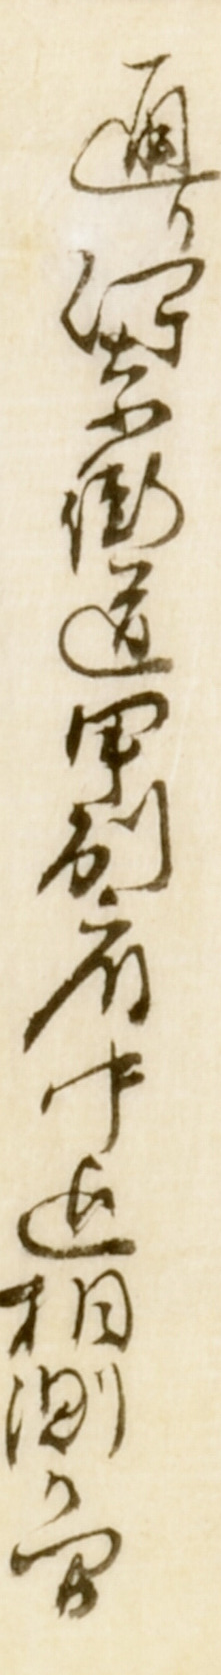通り伊奈街道甲州府中迄相測候間
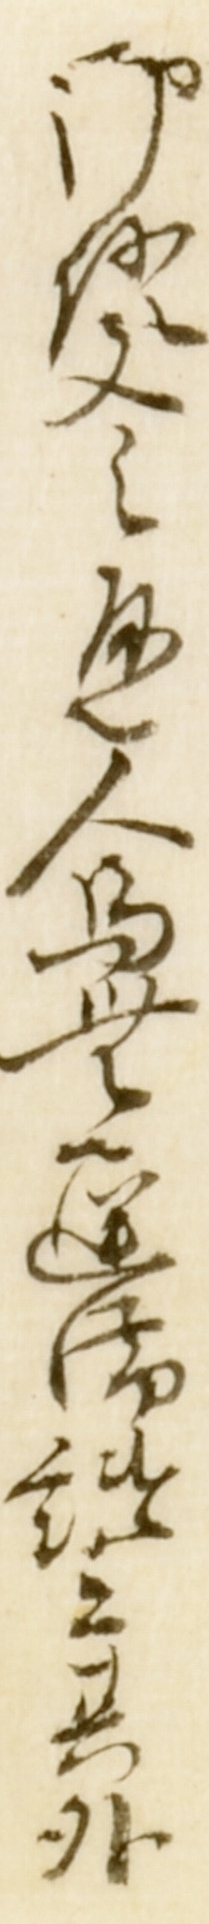御證文之通人馬無遅滞継立其外
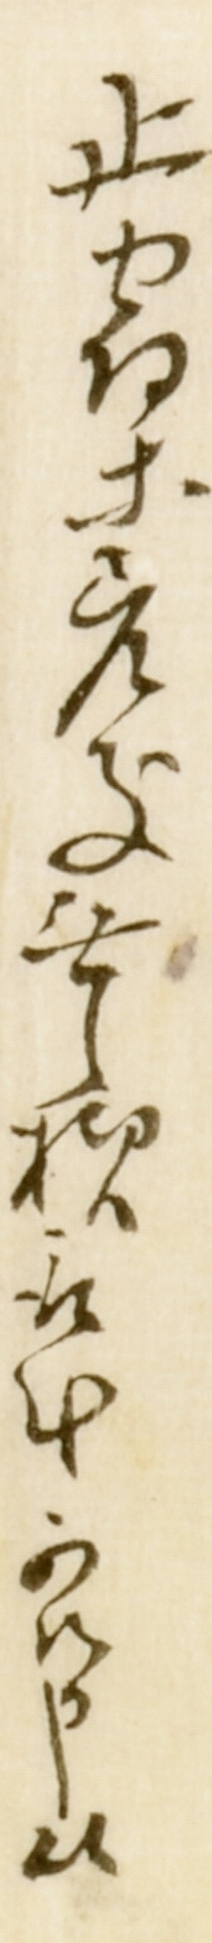止宿等差支無之様取斗可被申候
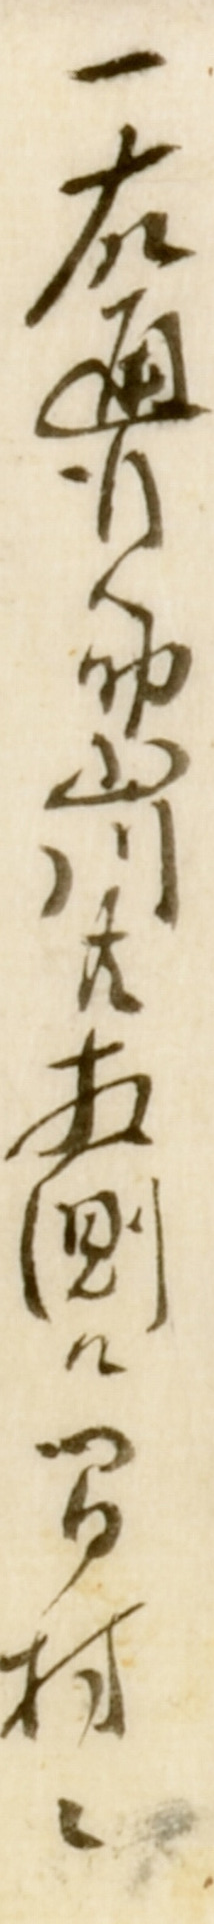一右通行筋山川共相測候間村々
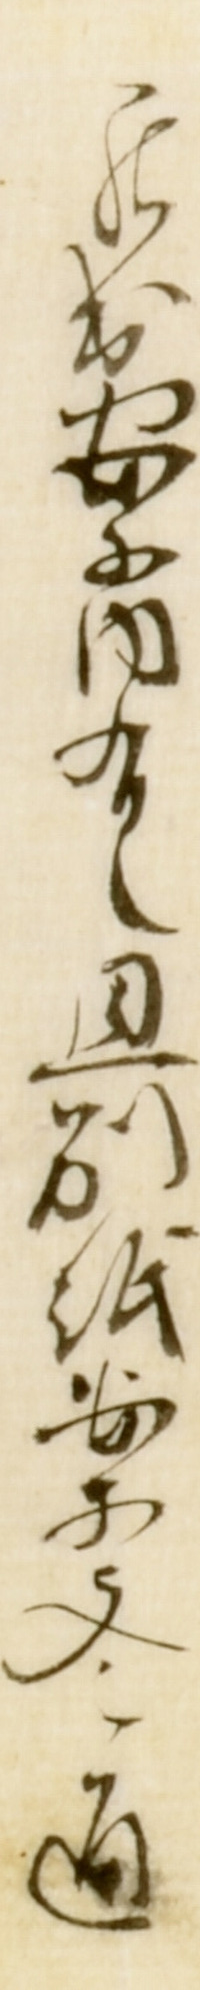罷出案内有之且別紙案文之通
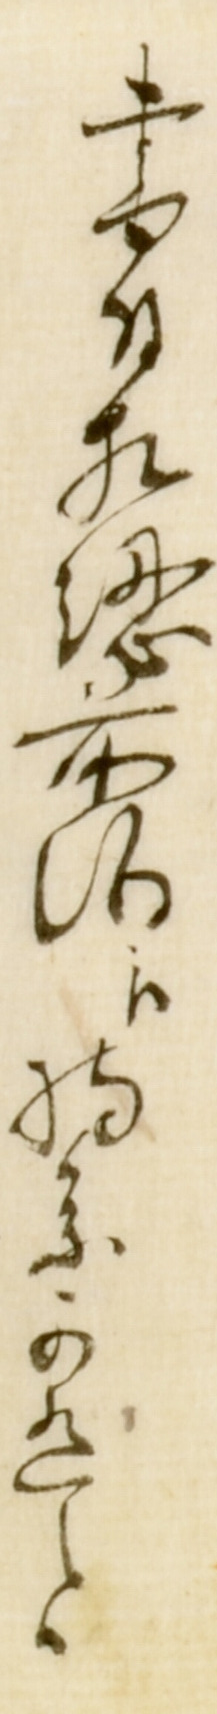書付相認前泊江持参可有之候
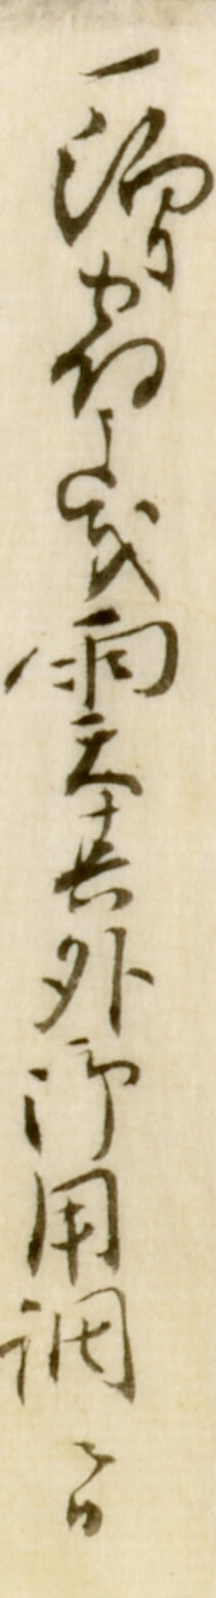一泊リ宿之義雨天其外御用調ニ而
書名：（触書写）
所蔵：伊那市立高遠町図書館・合同会社AMANE
